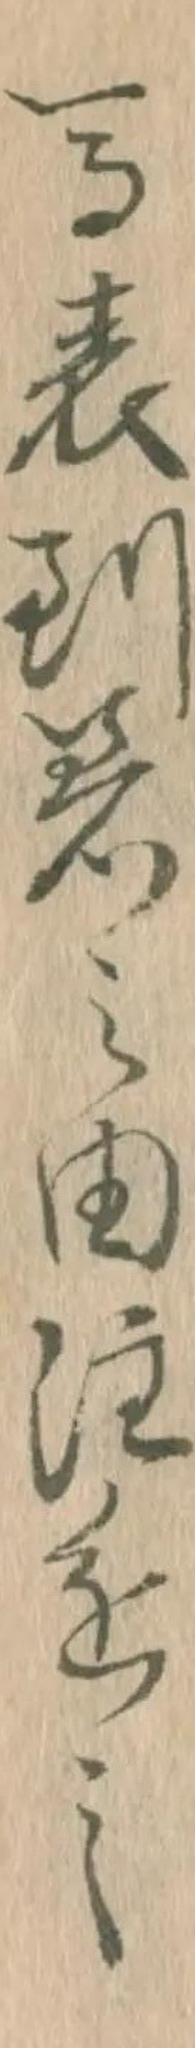馬表到着之由注進之
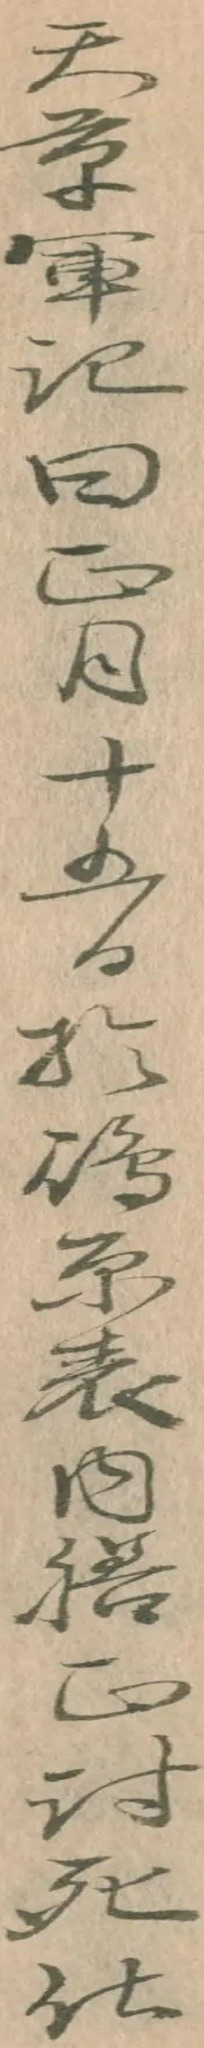天草軍記曰正月十五日於島原表内膳正討死仕
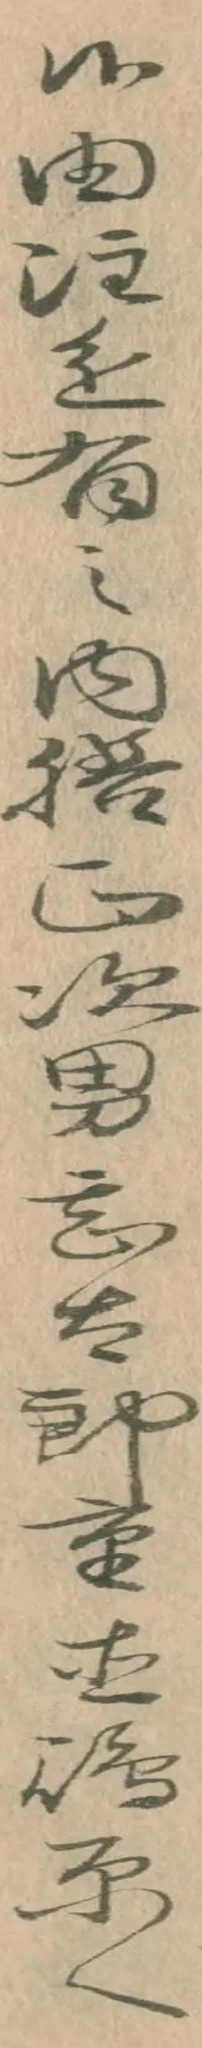候由注進有之内膳正次男甚太郎重直島原へ
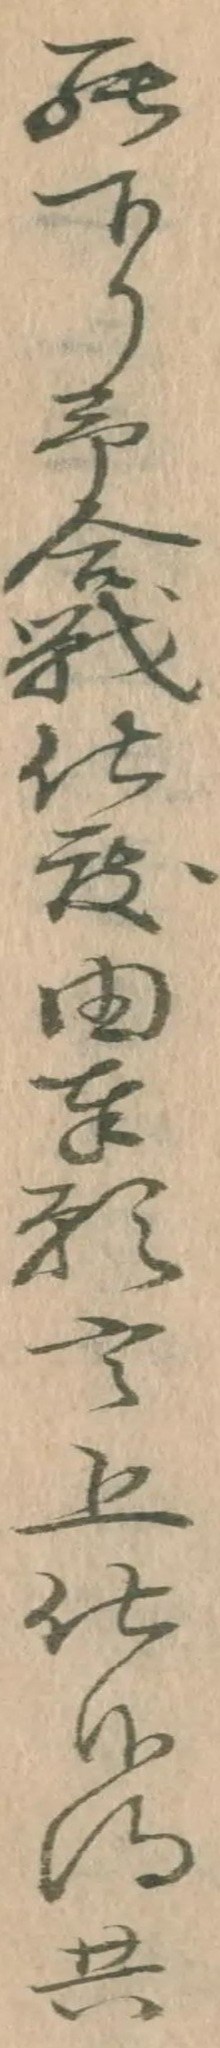罷下り弔合戦仕度由奉願言上仕候得共
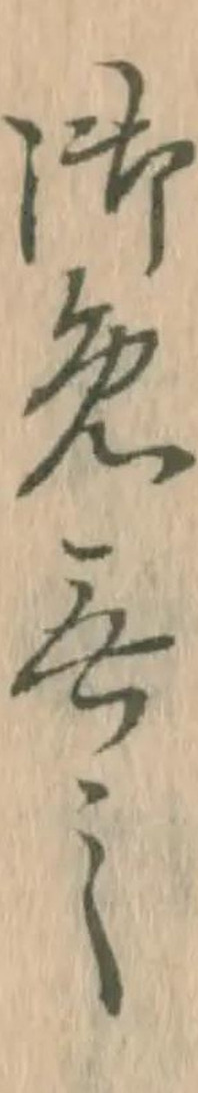御免無之
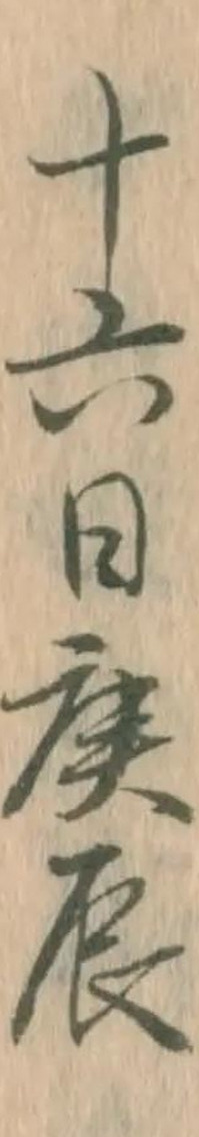十六日庚辰
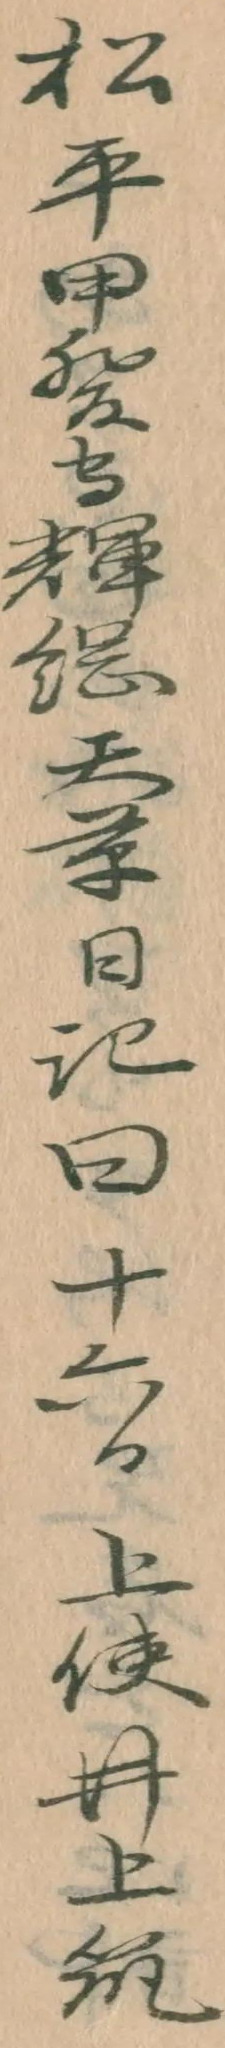松平甲斐輝綱天草日記曰十六日上使井上筑
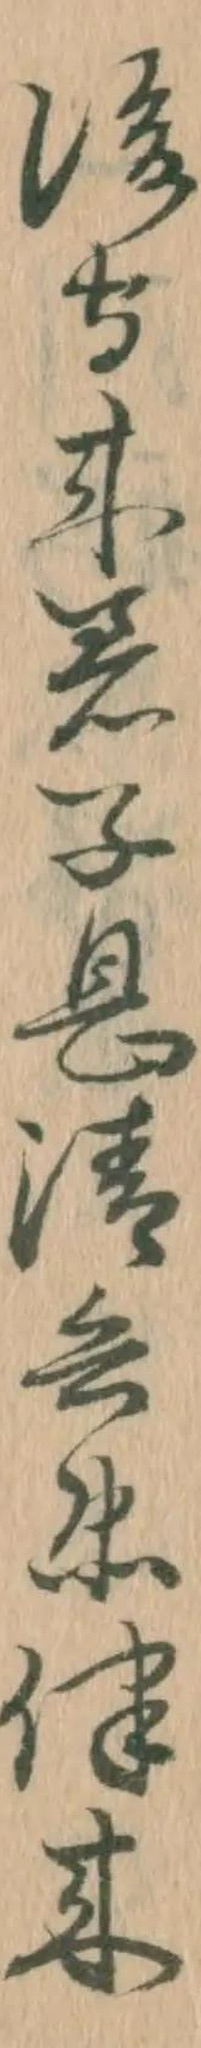後守来着子息清兵衛健来
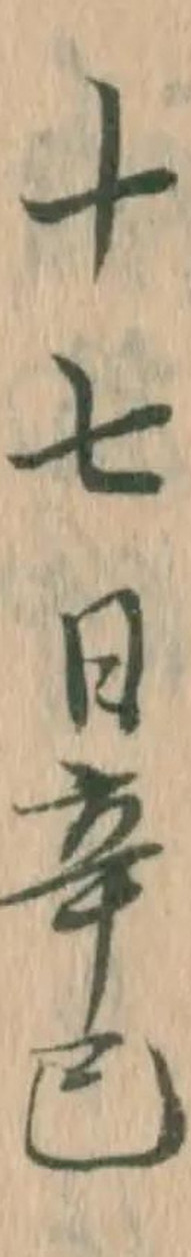十七日辛巳
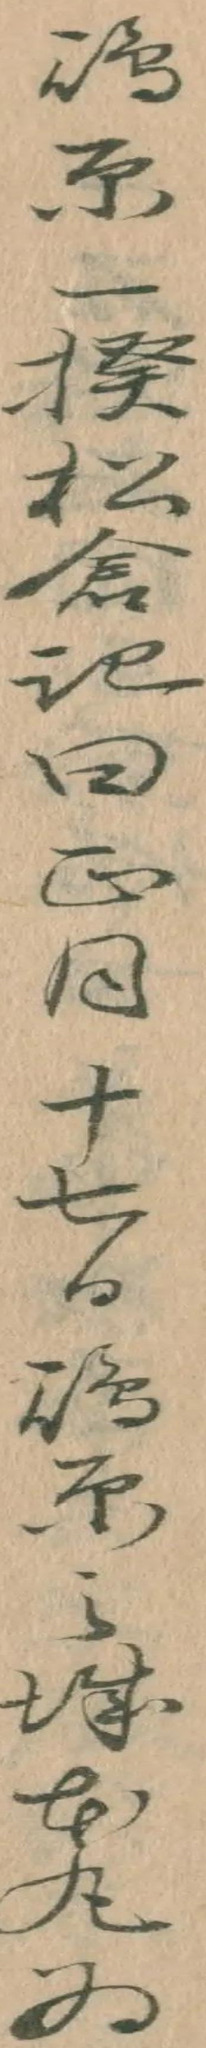島原一揆松倉記曰正月十七日島原之城本丸ゐ
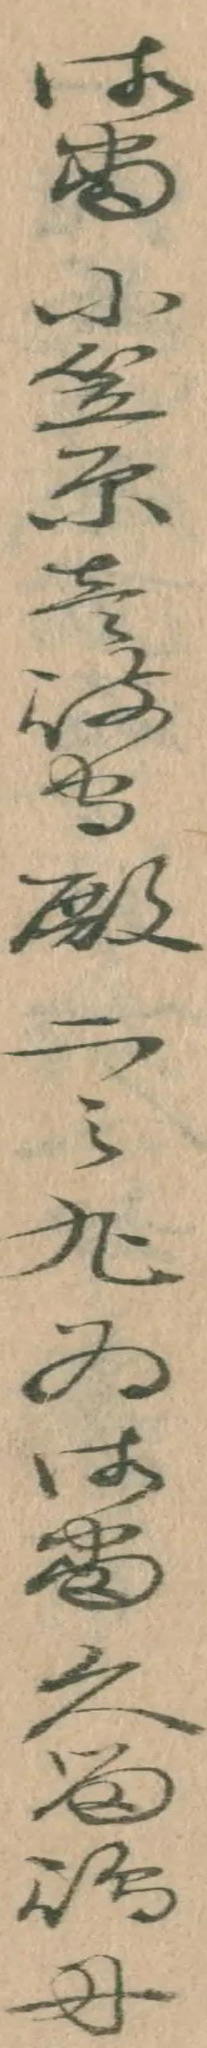御番小笠原壱岐守殿二之丸ゐ御番久留島丹
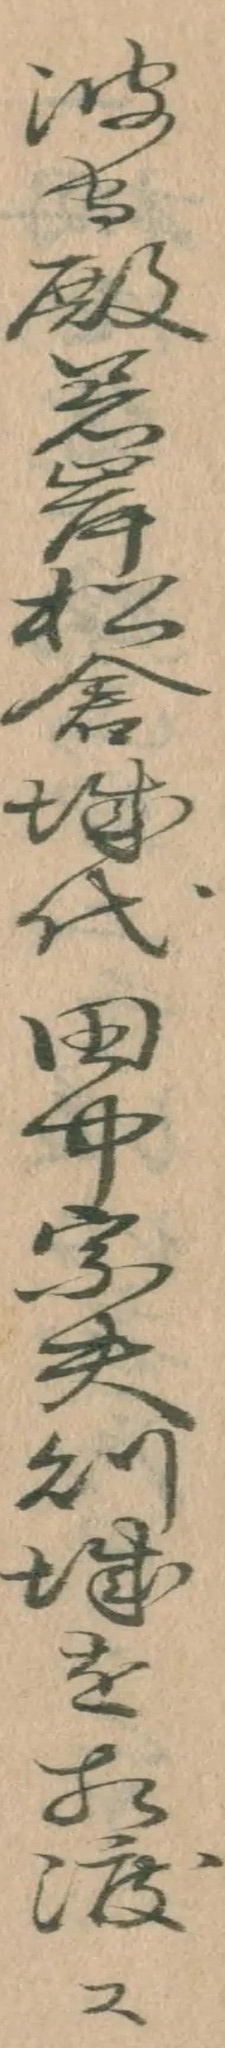波守殿着岸松倉城代田中宗夫則城を相渡す
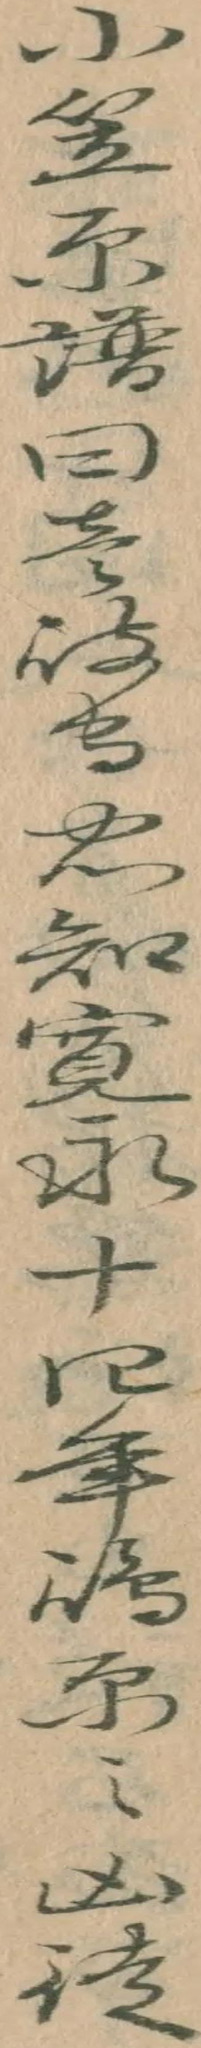小笠原譜曰壱岐守忠知寛永十四年島原之凶徒
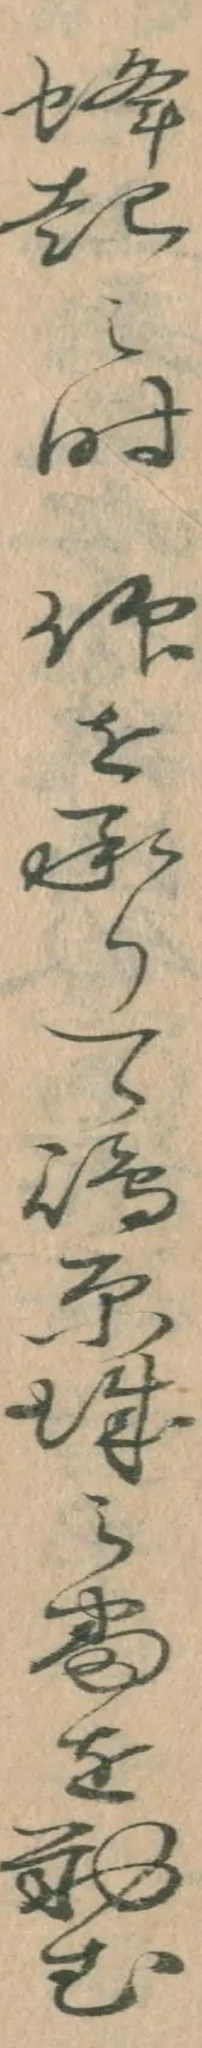蜂起之時仰を承りて島原城之番を勤む
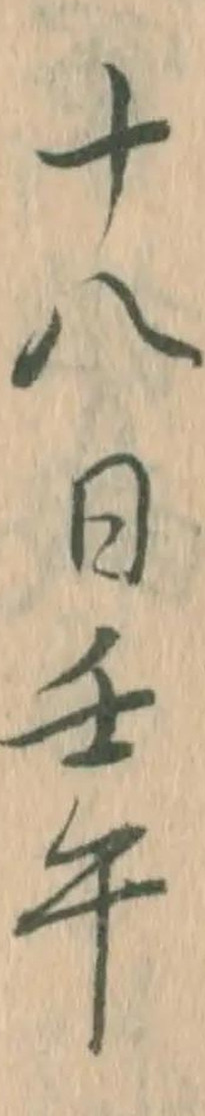十八日壬午

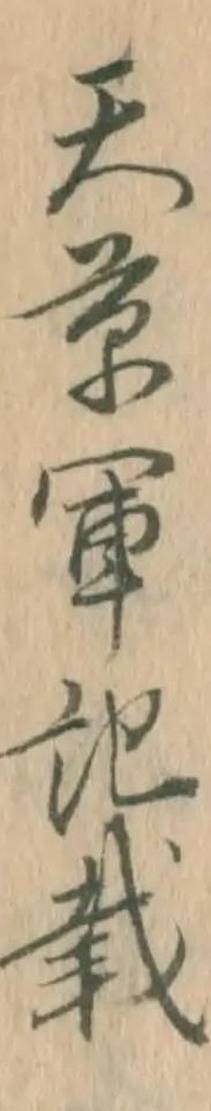天草軍記載
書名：切支丹御退治記 49巻. [6]
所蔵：国立国会図書館 National Diet Library, JAPAN
